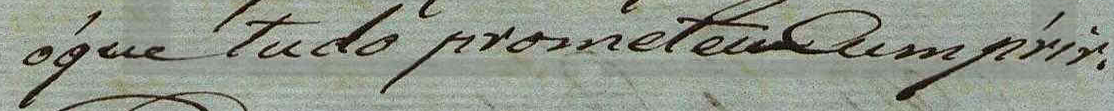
o que tudo prometeu Cumprir.
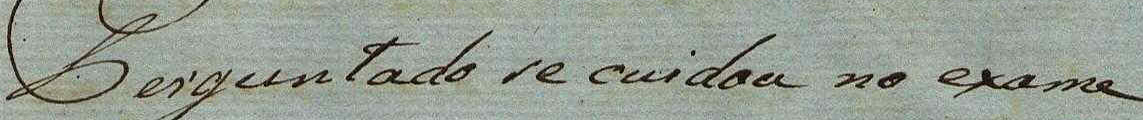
Perguntado se cuidou no exame
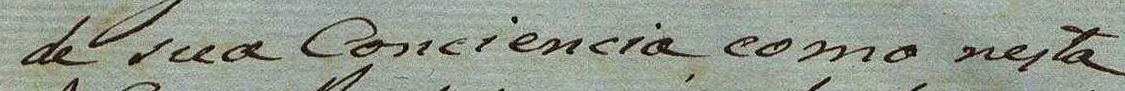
de sua conciencia, como nesta
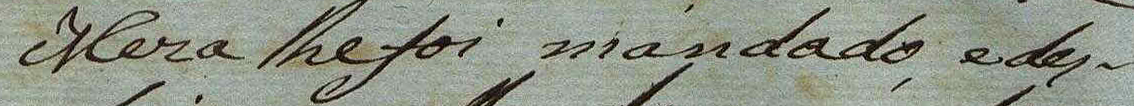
Meza lhe foi mandado, e des
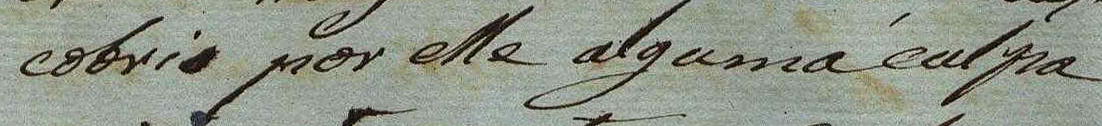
cobrio por elle alguma culpa
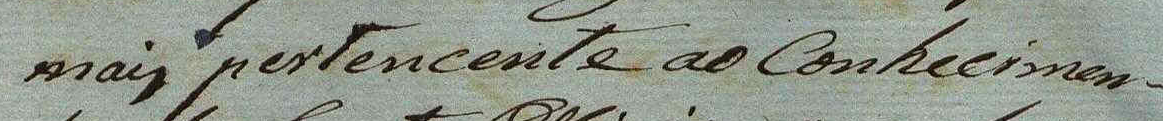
mais pertencente ao conhecimen
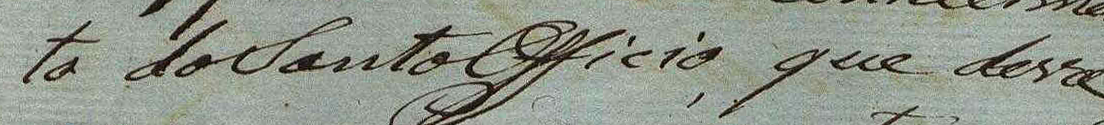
to do Santo Officio, que deva
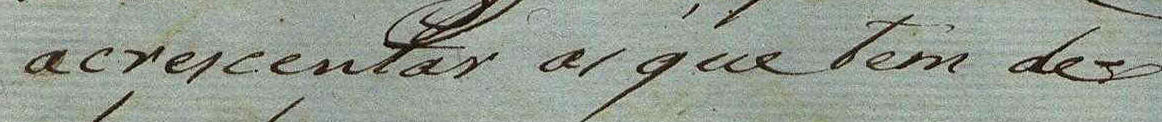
acrescentar as que tem de
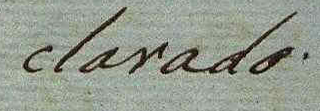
clarado.
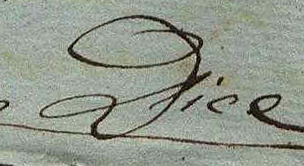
Dice
